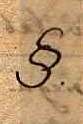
§.
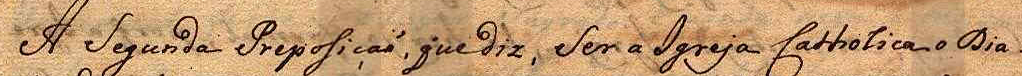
A Segunda Preposiçaõ, que diz, ser a Igreja Catholica o Dia
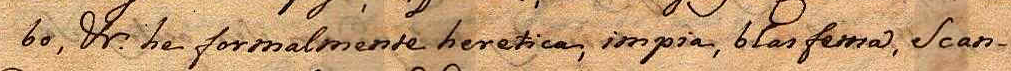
bo, &r. he formalmente heretica, impia, blasfema, scan
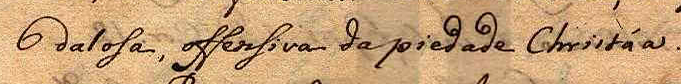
dalosa; offensiva da piedade Christãa.
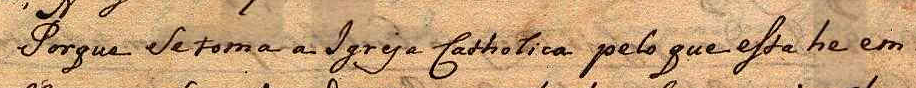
Porque se toma a Igreja Catholica pelo que esta he em
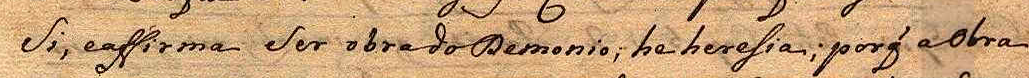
Si, e affirma ser obra do Demonio, he heresia; porq̄ a obra
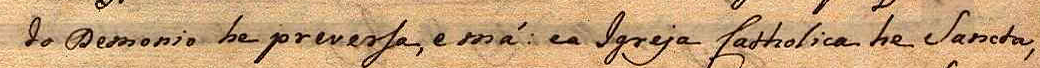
do Demonio he prevarsa, e má e a Igreja Catholica he Sancta,
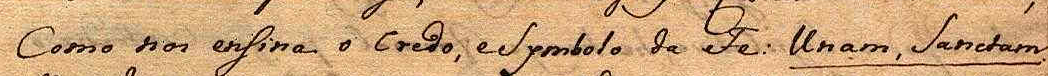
Como nos ensina o credo, e Symbolo da Fé: Unam, Sanctam,
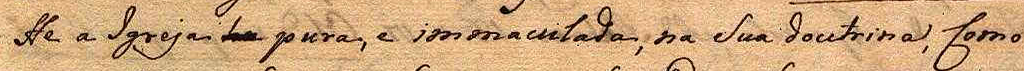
He a Igreja he pura, e immaculada, na sua doutrina, Como
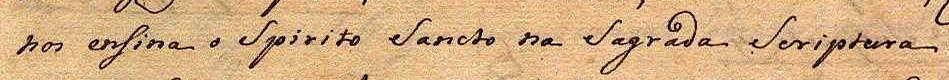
nos ensina o Spirito Sancto na Sagrada Scriptura.
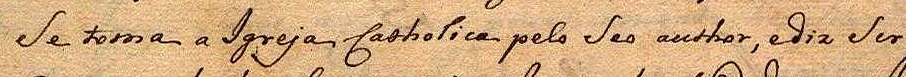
Se torna a Igreja Catholica pelo Seo author, e diz ser
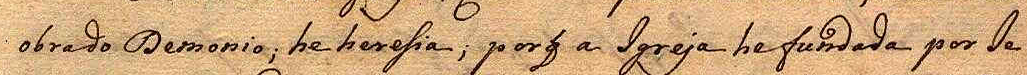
obra do Demonio, he heresia, porq̄ a Igreja he fundada por Ie
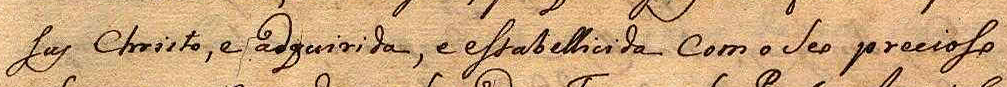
sus Christo, e adquirida, e estabellicida com o seo precioso
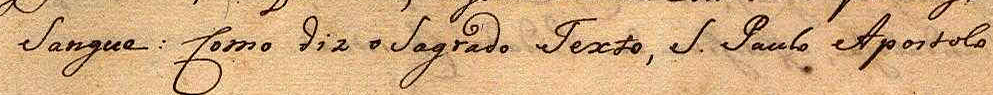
Sangue. Como diz o Sagrado Texto, S. Paulo Apostolo
